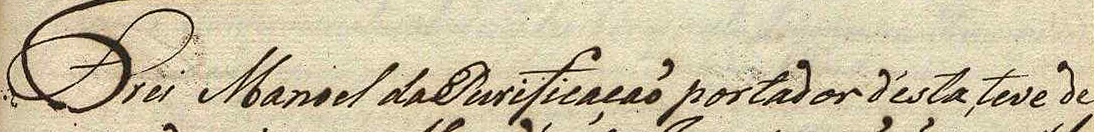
Frei Manoel da Purificaçaõ portador desta, teve de
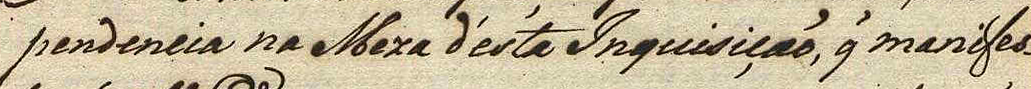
pendencia na Meza d'esta Inquisiçaõ, q̄ manifes
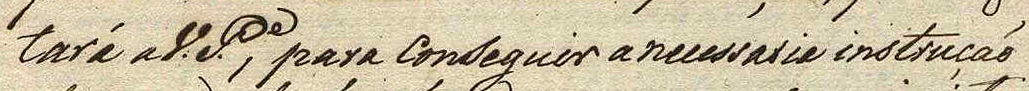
tará a V. P.e, para conseguir a necessaria instruçaõ
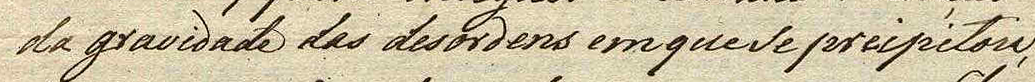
da gravidade das desordens em que se precipitou,
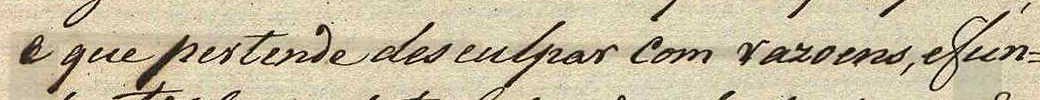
e que pertende desculpar com razoens, e fun
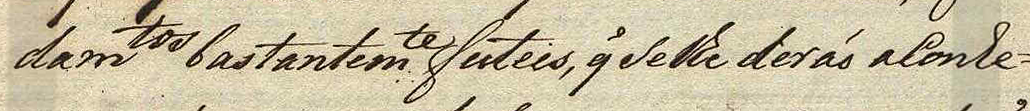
dam.tos bastantem.te futeis, q̄ se lhe deraõ a Conhe
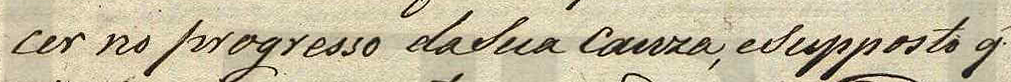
cer no progresso da Sua cauza, e supposto q̄
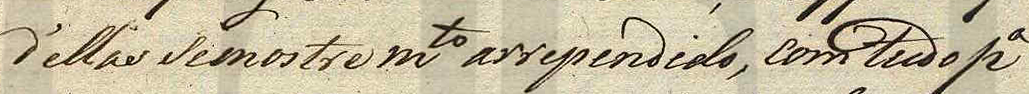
d'ellas se mostre m.to arrependido, comtudo p.a
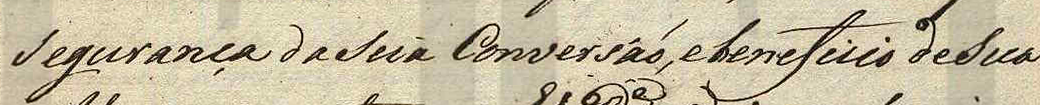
segurança da sua Conversaõ, e beneficio de Sua
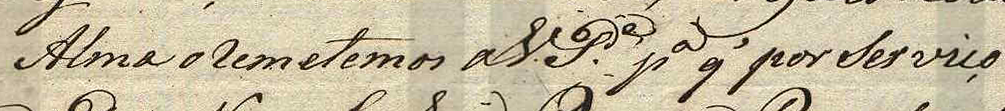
Alma o Remetemos a V. P.e p.a q̄ por serviço
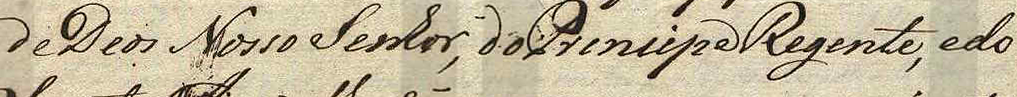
de Deos Nosso Senhor, do Principe Regente, e do
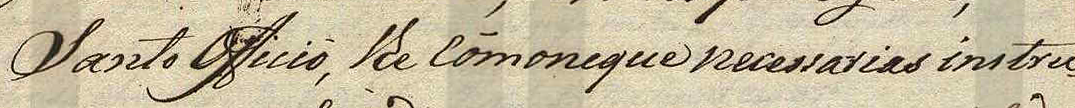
Santo Officio, lhe cōmoneque necessarias instru
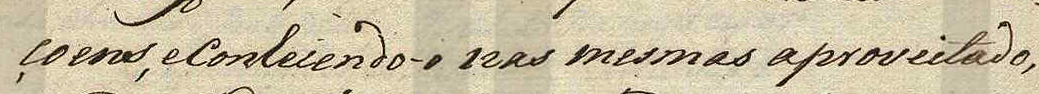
çoens, e conhecendo-o nas mesmas aproveitado,
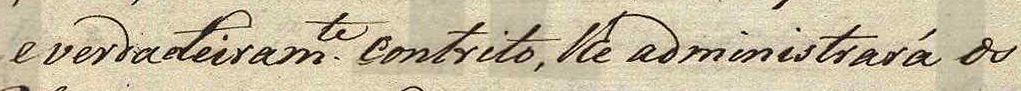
e verdadeiram.te contrito, lhe administrará os
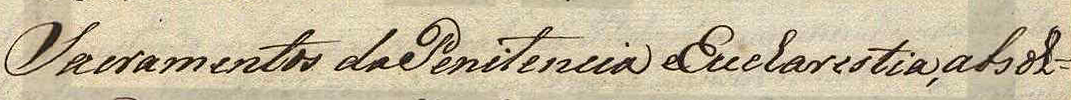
Sacramentos da Penitencia e Eucharestia, absol
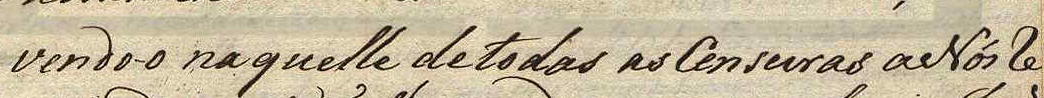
vendo-o naquelle de todas as Censuras a Nós Re
